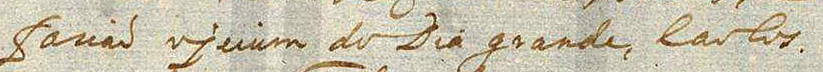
faziaõ o jeium do Dia grande, E ao Cos.
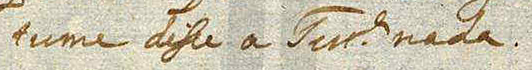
tume disse a Test.a nada.
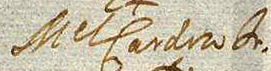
Mel Cardozo Ir.
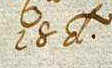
28 d̄.o
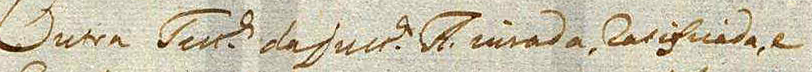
Outra Test.a da Just.a A. iurada, Ratificada, e
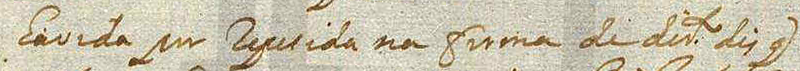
havida por Repetida na forma de dir.to dis q̄
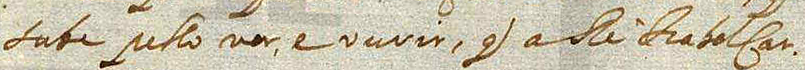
sabe pello ver, e ouvir, q̄ a Re Izabel Car
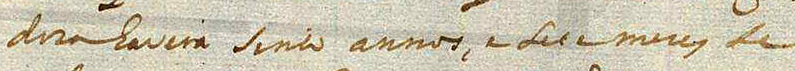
doza haverá sinco annos, e sete mezes se
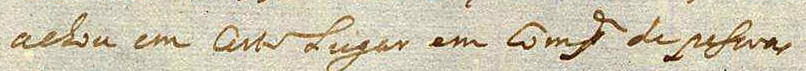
achou em certo Lugar em Compa de pessoas
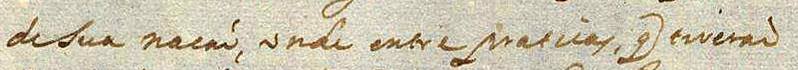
de sua naçaõ, onde entre praticas, q̄ tiveraõ
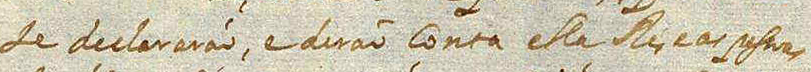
se declararaõ, e deraõ Conta ella Re e as pessoas
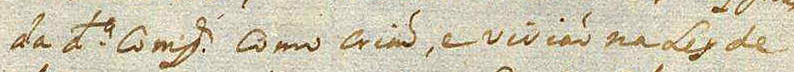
da d̄.a comp.a como criaõ, e viviaõ na Ley de
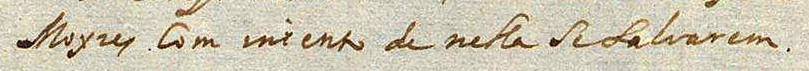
Moyzes Com intento de nella se salvarem.
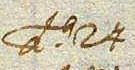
d̄.a 24
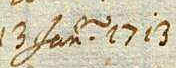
13 Jan.ro 17i3
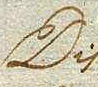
Dis
